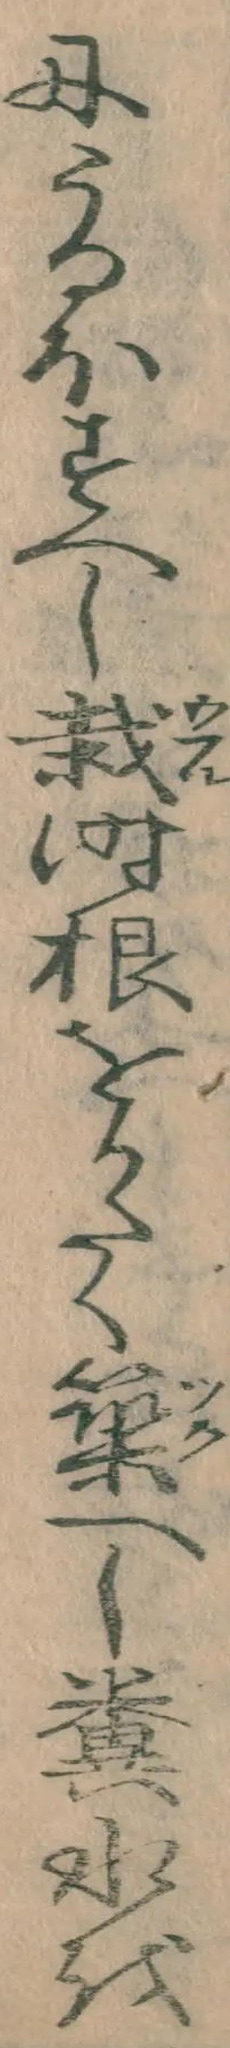にうるほすへし栽時根をかたく築へし糞水を
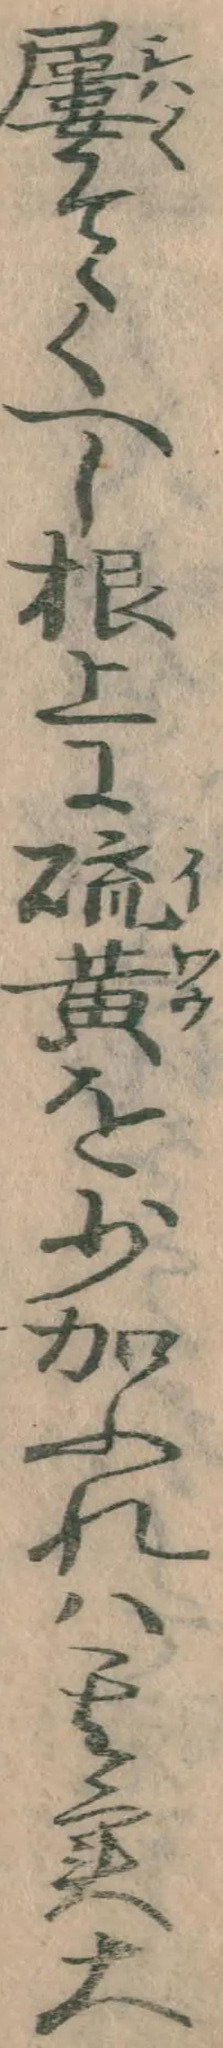屡そゝくへし根上に硫黄を少加ふれは其実大
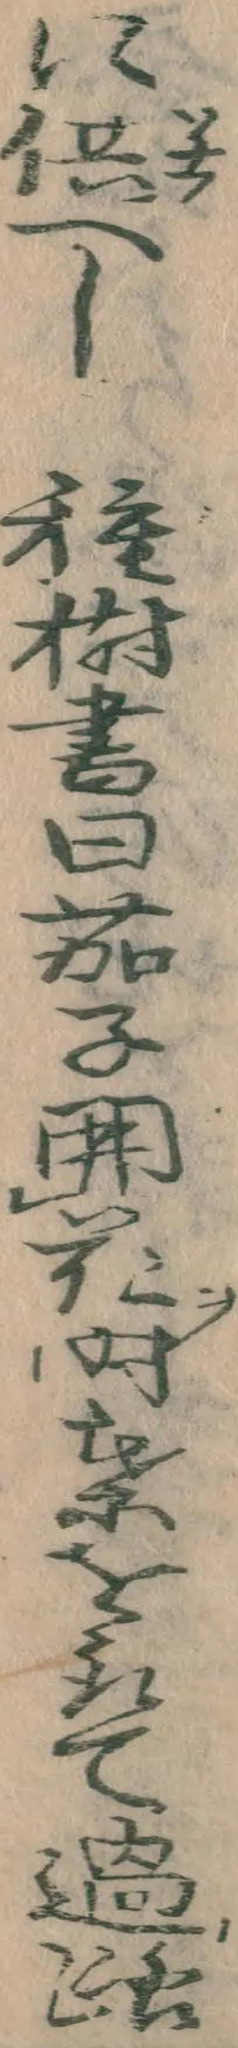に供へし種樹書曰茄子開花時葉を取て過路
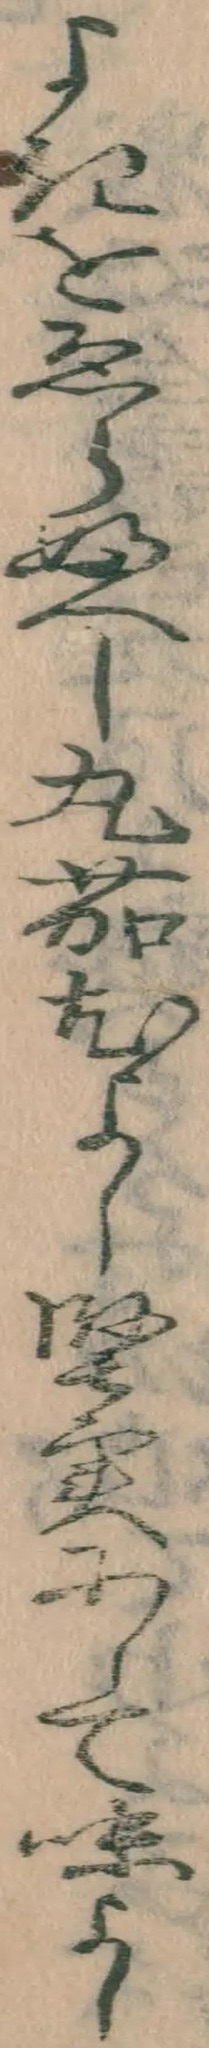よきをゑらふへし丸茄尤よし堅実にして味よし
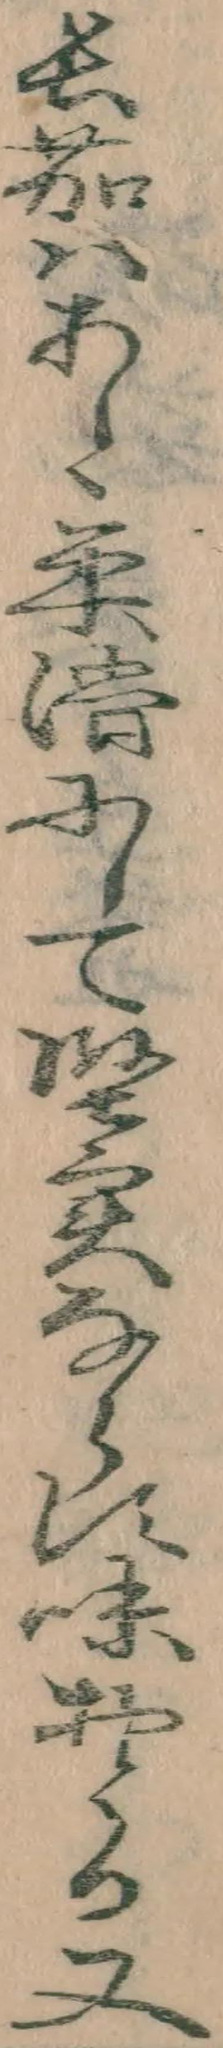長茄はあしく柔滑にして堅実ならす味おとり又
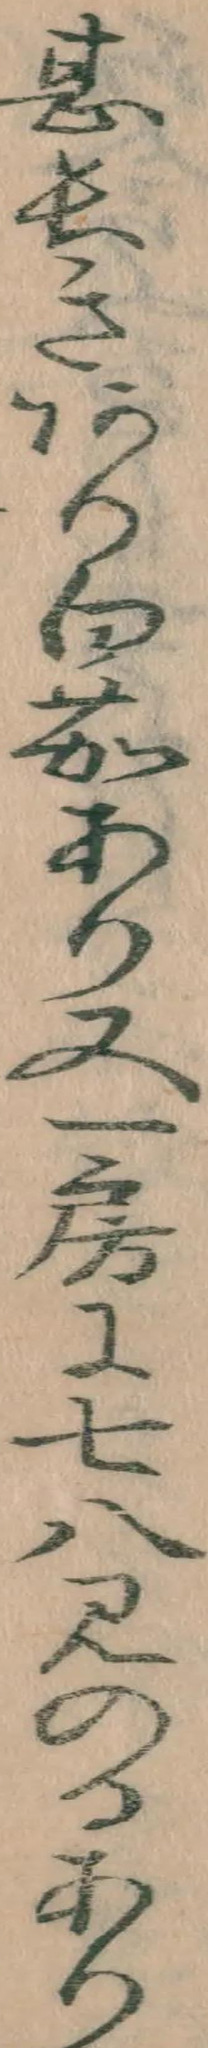甚長きあり白茄あり又一房に七八みのるあり
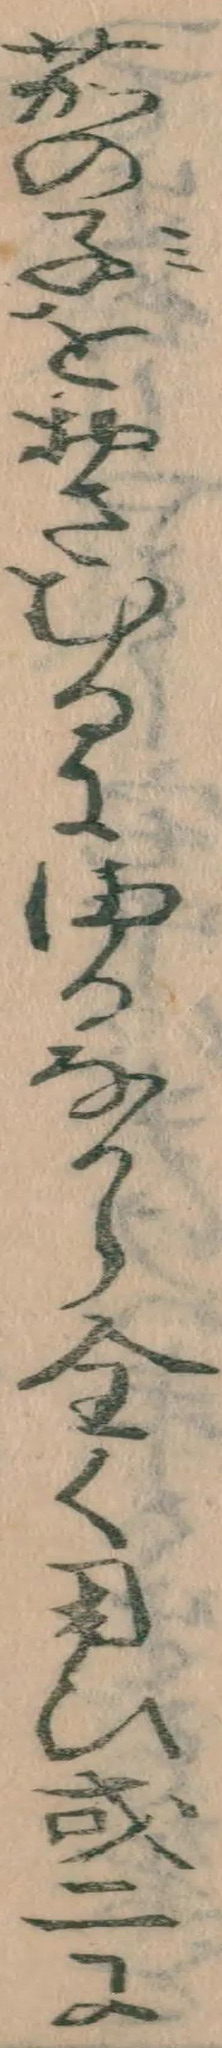茄の子をおさむるにまかなから全く用ひ或二に
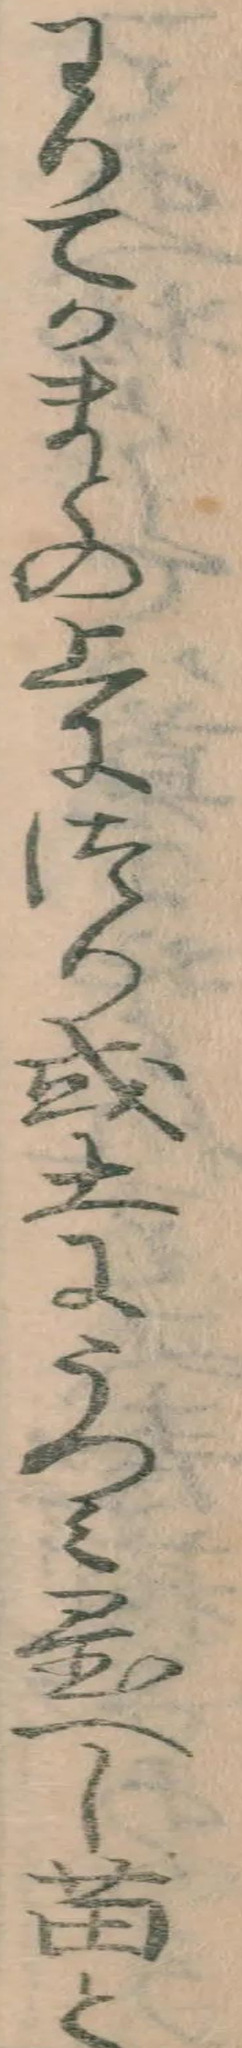わりてかまとの上につり或土にうつみ置へし苗と
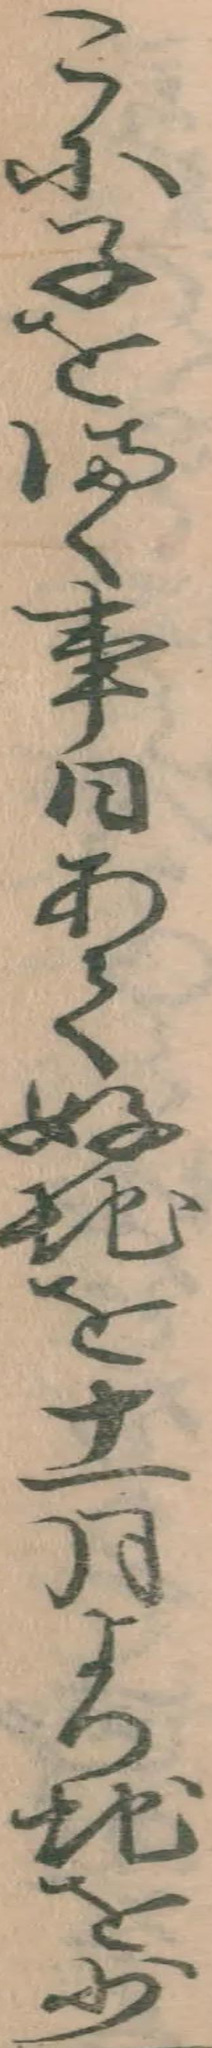こに子をまく事日あて好地を十一月より地を少
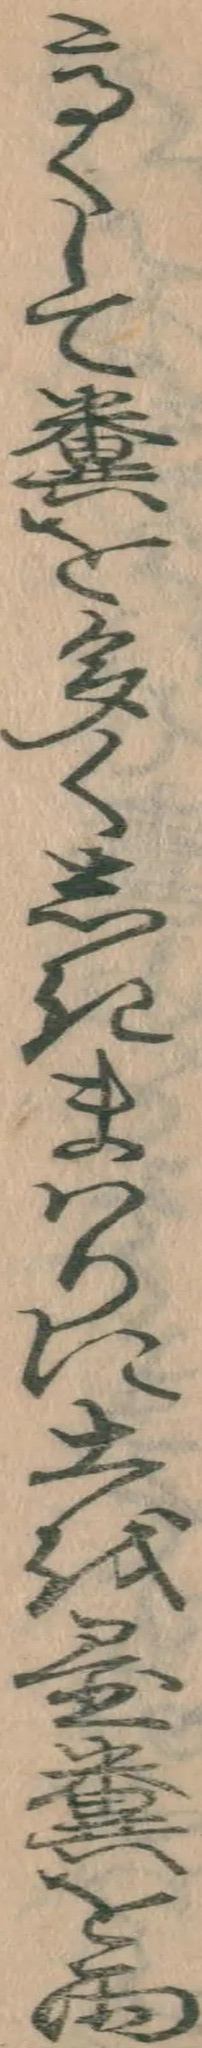高くして糞を多くしきまはりに土を置糞を雨
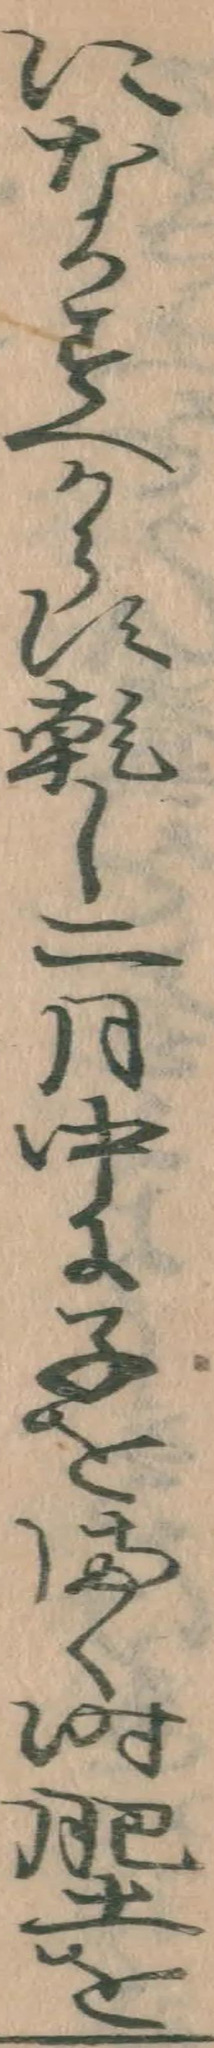になかすへからす乾し二月中に子をまく時肥土を
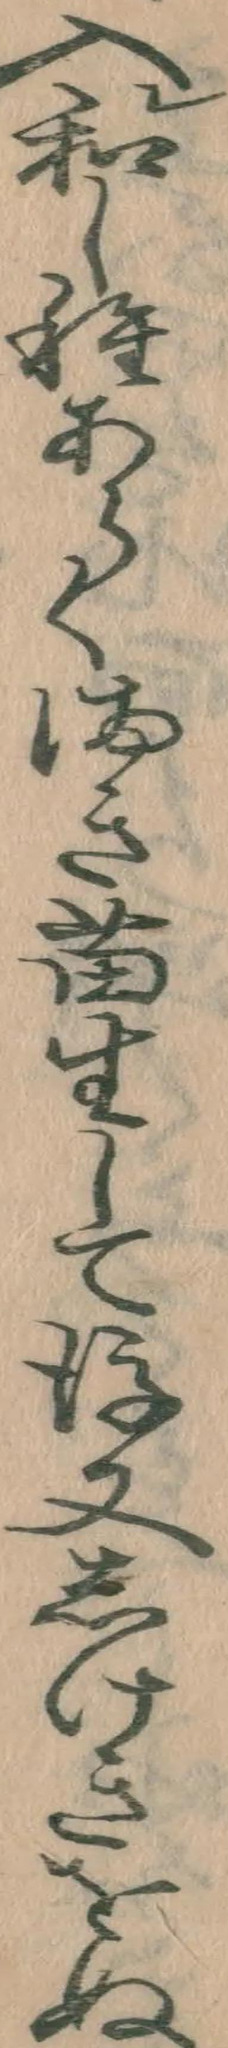入和し種あらくまき苗生して後又しけきをぬ
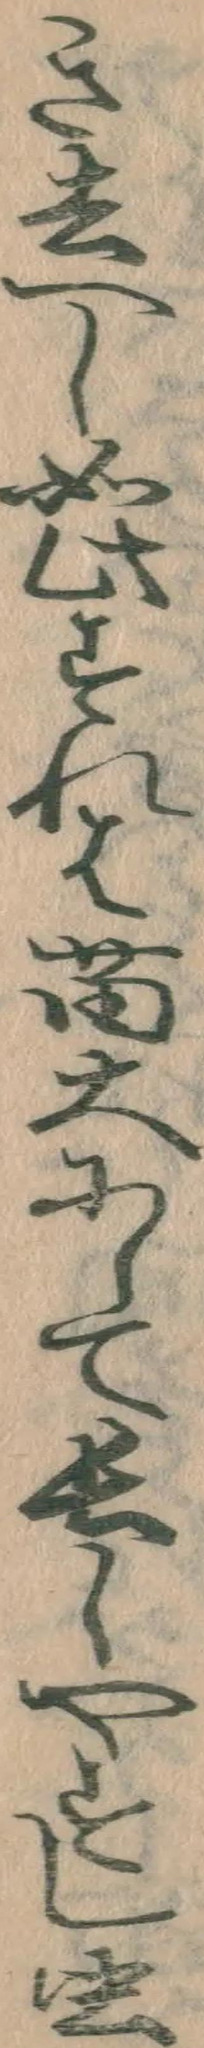き去へし如此すれは苗大にして長しやすし虫
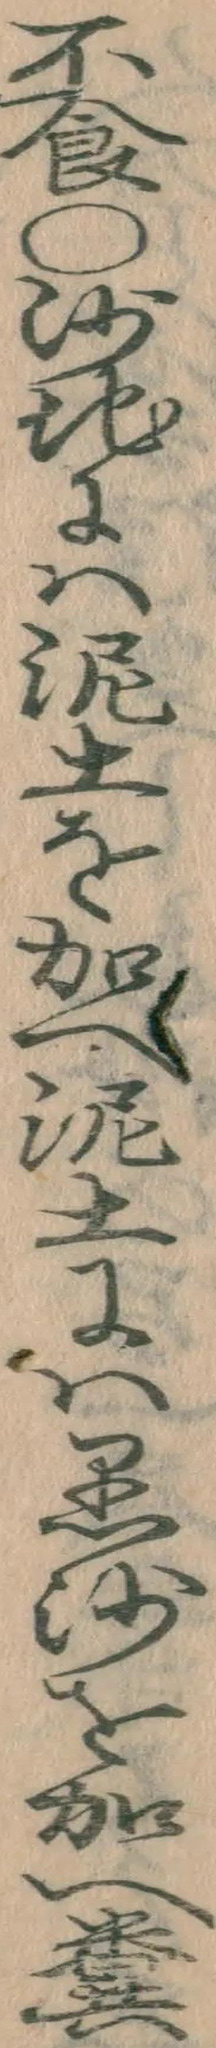不食〇沙地には泥土を加へ泥土には黒沙を加へ糞
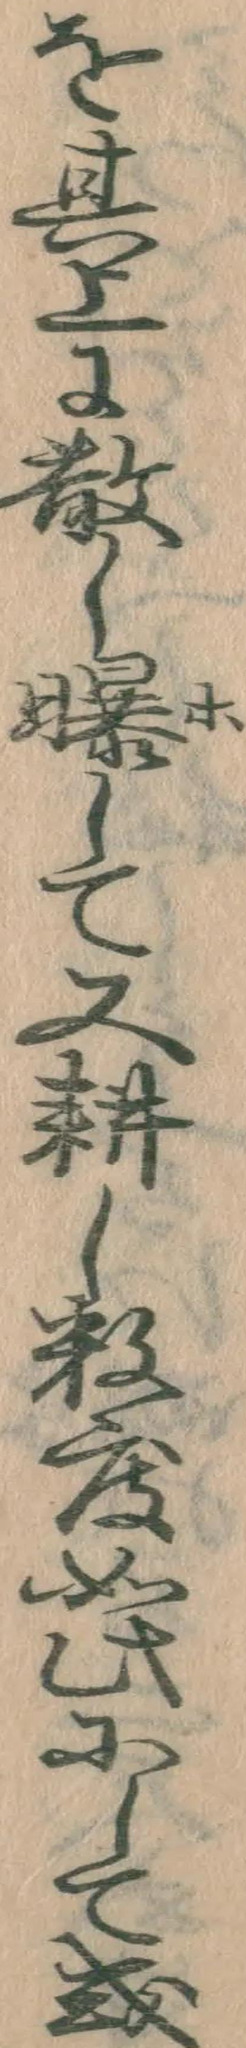を其上に散し曝して又耕し数度如此にして或
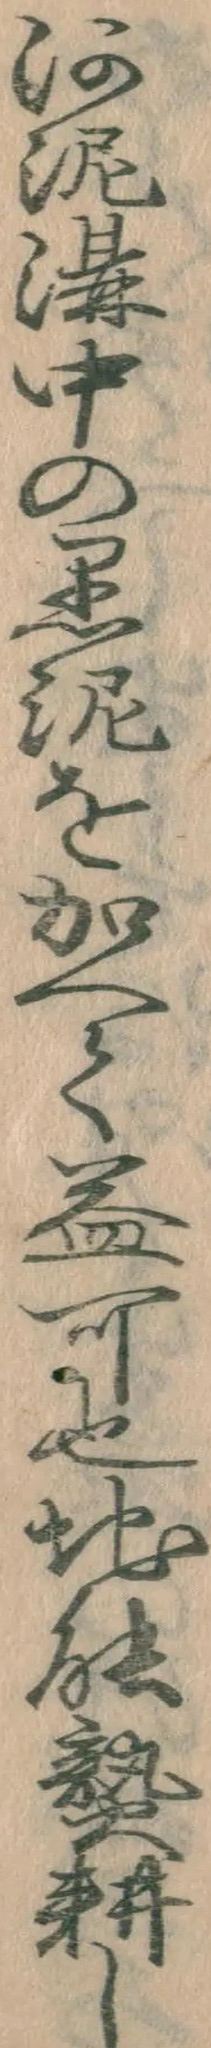河泥溝中の黒泥を加へて益可也能熟耕し
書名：菜譜 3巻
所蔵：国立国会図書館 National Diet Library, JAPAN
